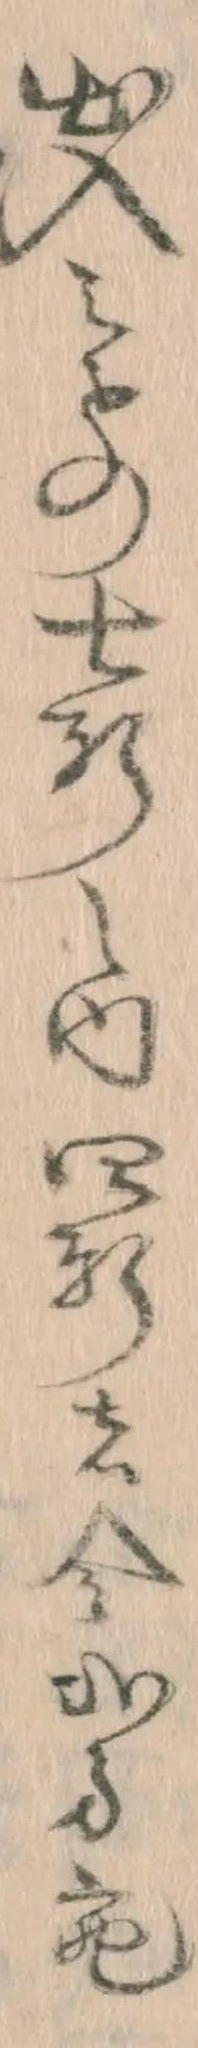出入之もの七軒之内四軒は金弐分宛
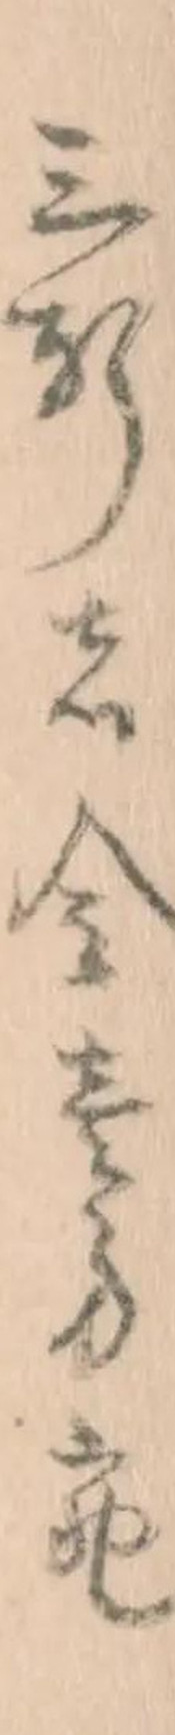三軒は金壱分宛
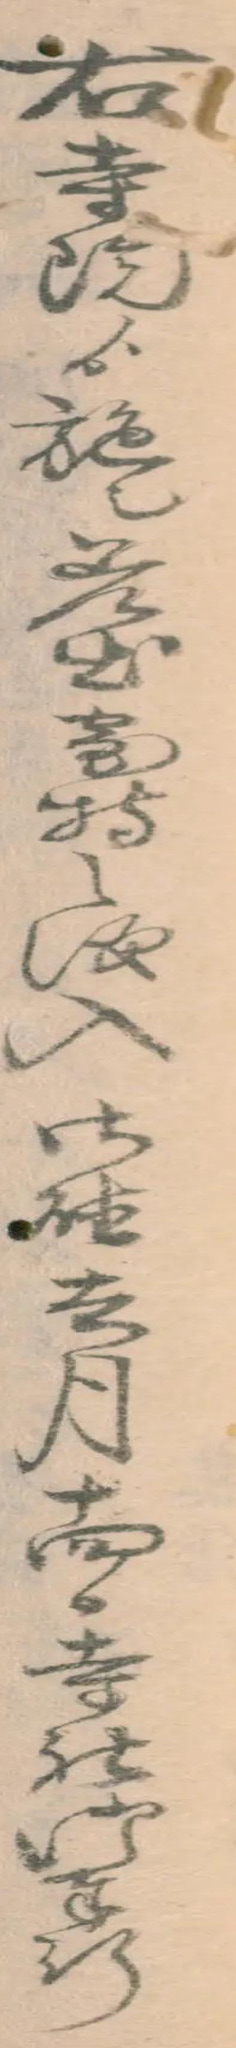右寺院ゟ施シ差出奇特之儀入御聴去月十四日寺社御奉行
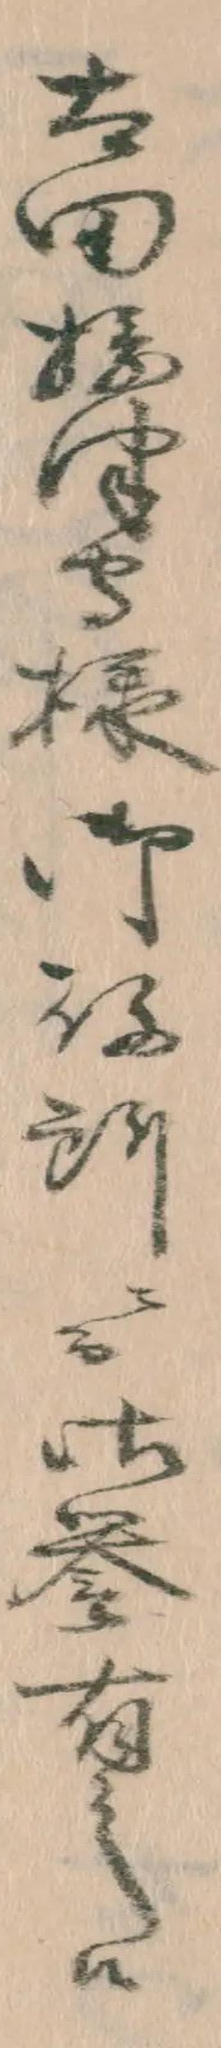太田摂津守様御役所ニ而御誉有之候
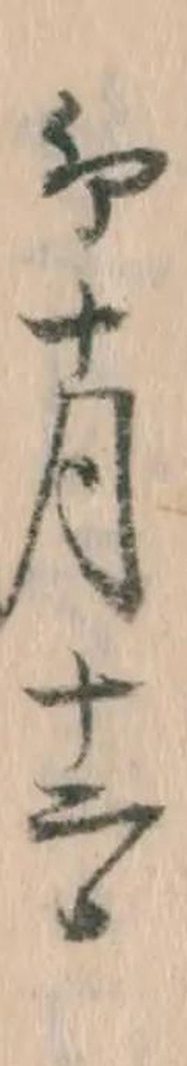卯十月十二日
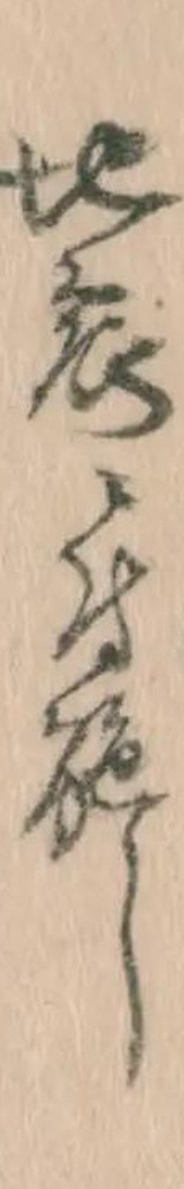地震ニ付施し
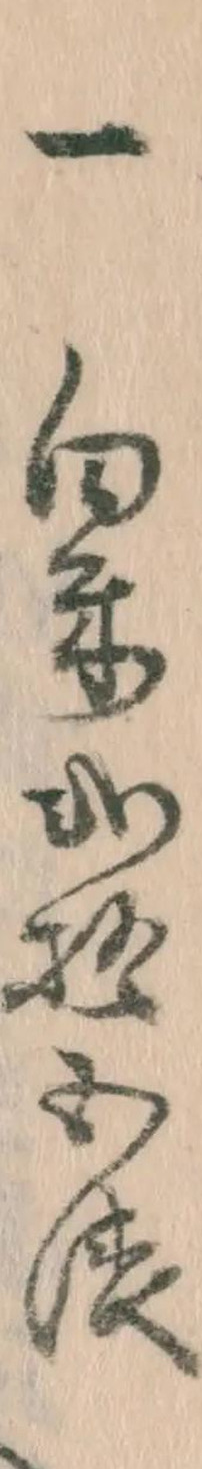一白米弐拾五俵右
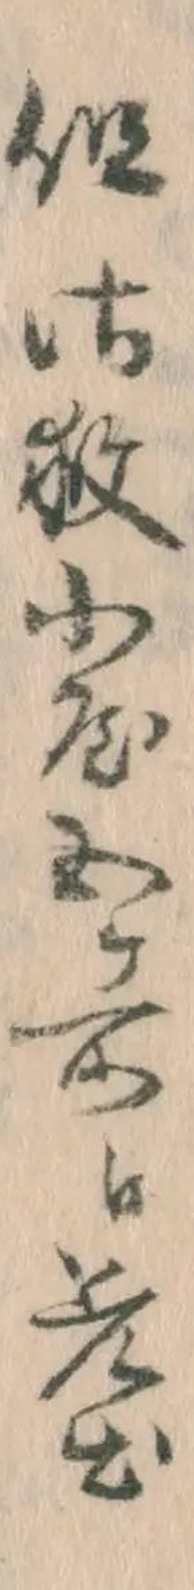但御救小屋五ケ所え差出
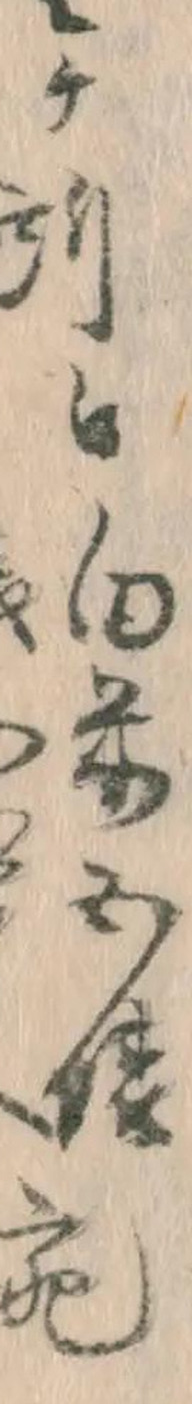壱ケ所え白米五俵
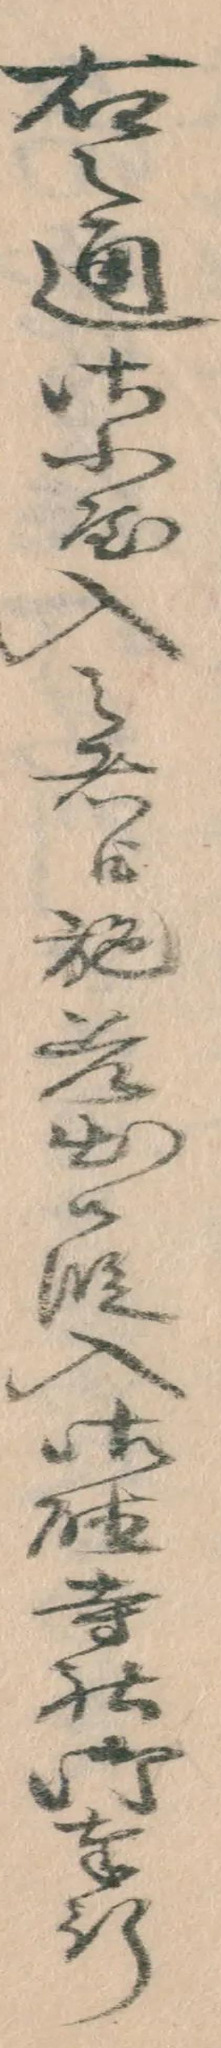右之通御小屋入之者え施差出候段入御聴寺社御奉行

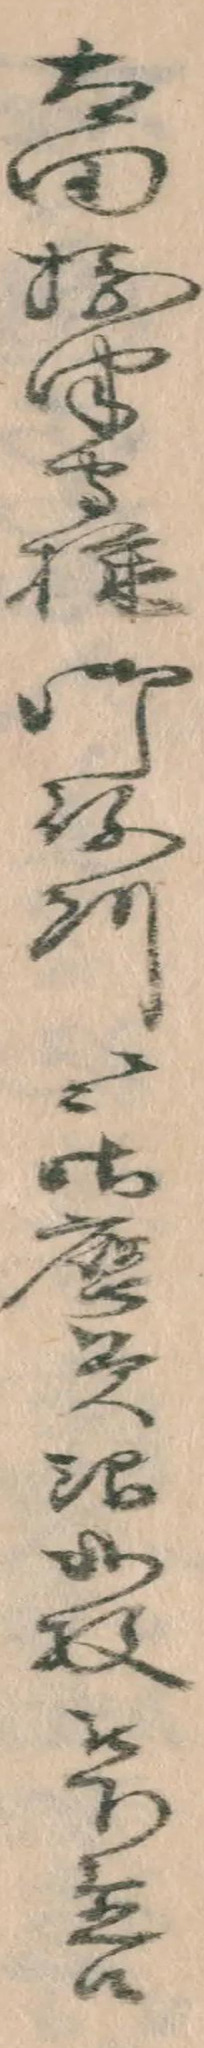太田摂津守様御役所ニ而御褒美銀弐枚被下置候
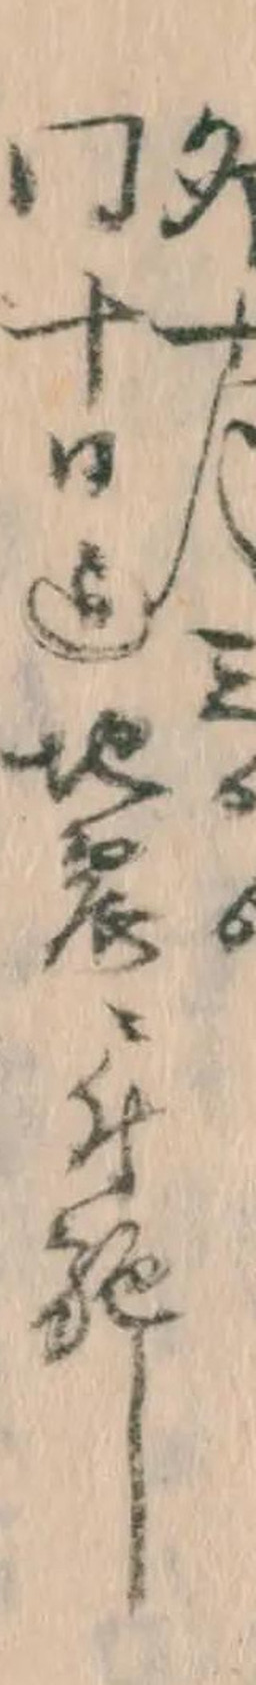同十日迄地震ニ付浄土宗
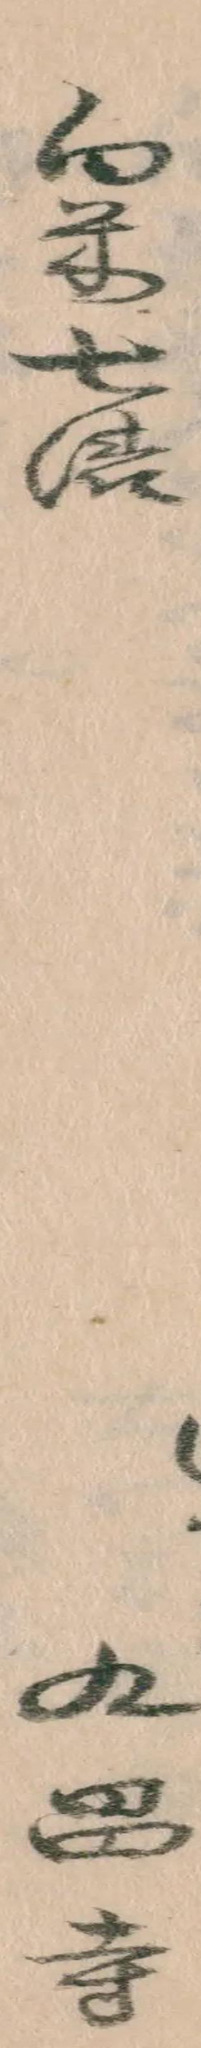一白米七俵九品寺
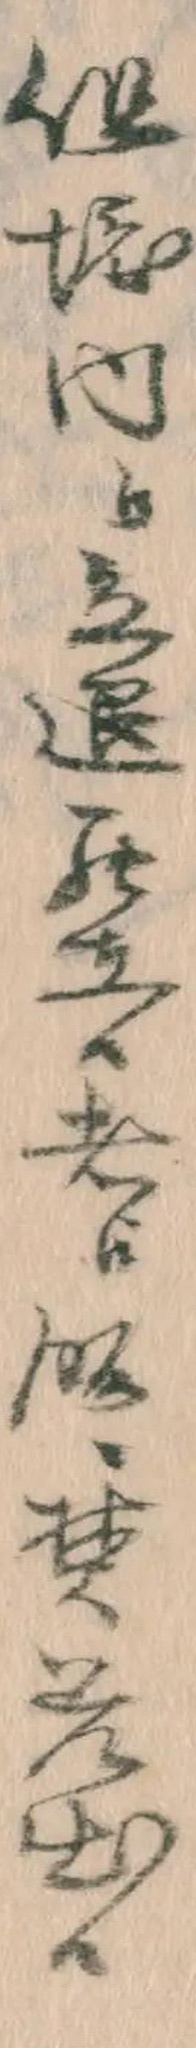但境内え立退罷在候者え飯ニ焚差出候
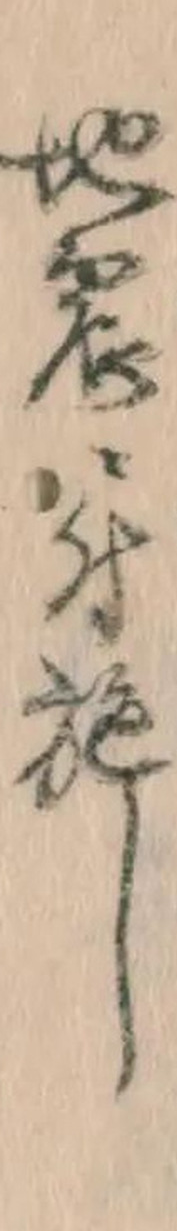地震ニ付施し禅宗
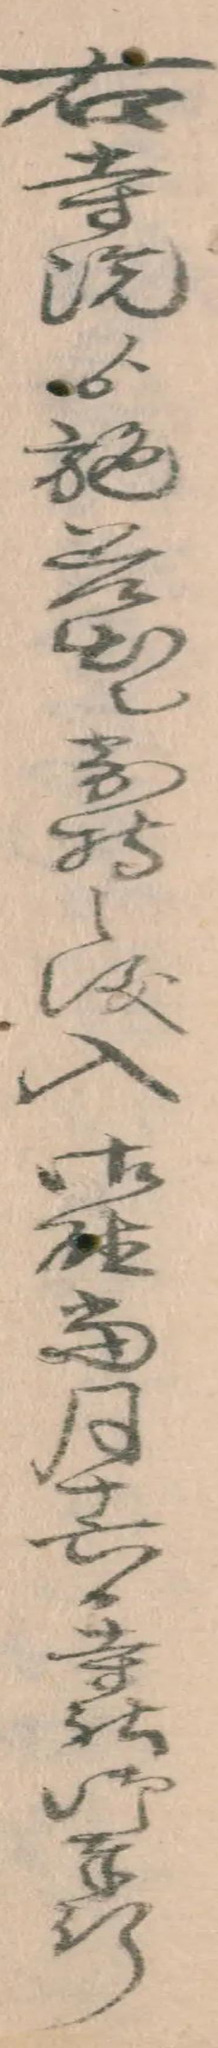右寺院ゟ施差出シ奇特之儀入御聴当月十六日寺社御奉行
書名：武家方并寺院等ニテ施差出候一件
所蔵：国立国会図書館 National Diet Library, JAPAN
